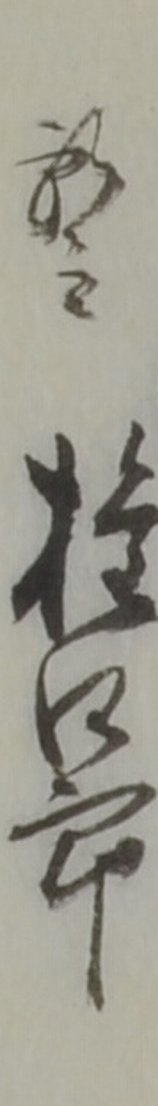願主権四郎
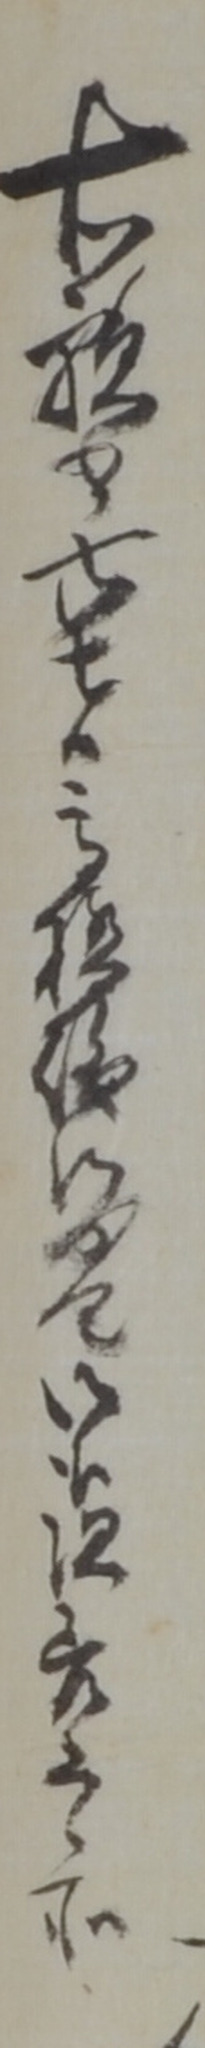右願書廿七日高橋儀御沙汰御取次差上候所
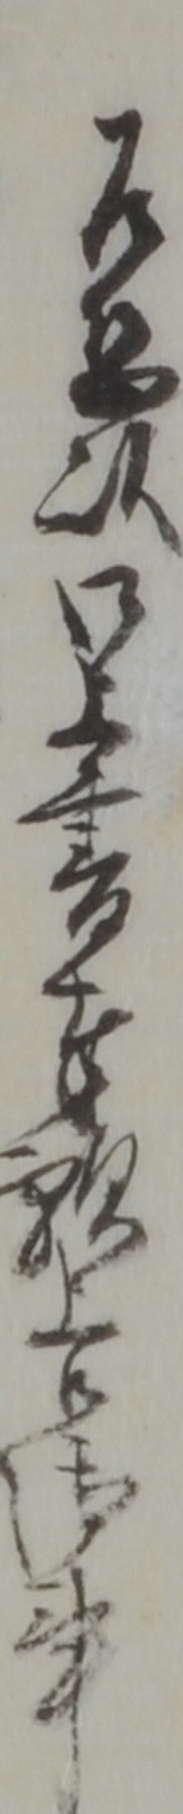乍恐以口上書奉願上候御事
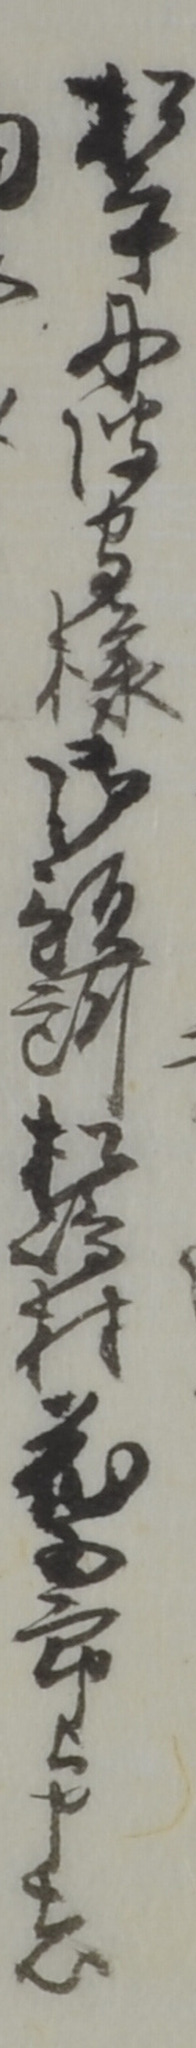松平丹波守様御預所松嶋村藤五郎与申者
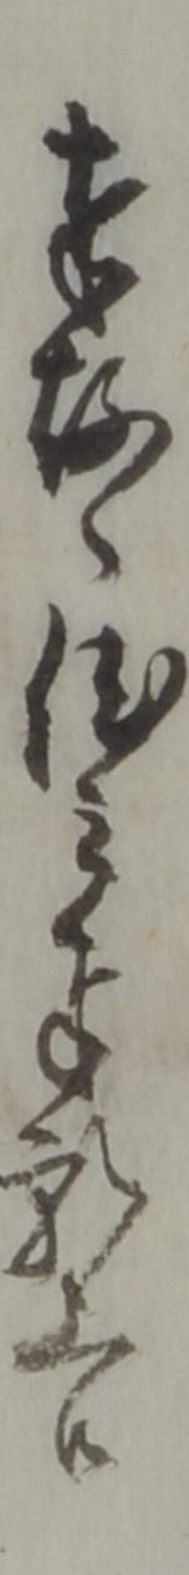奉存候依之奉願上候
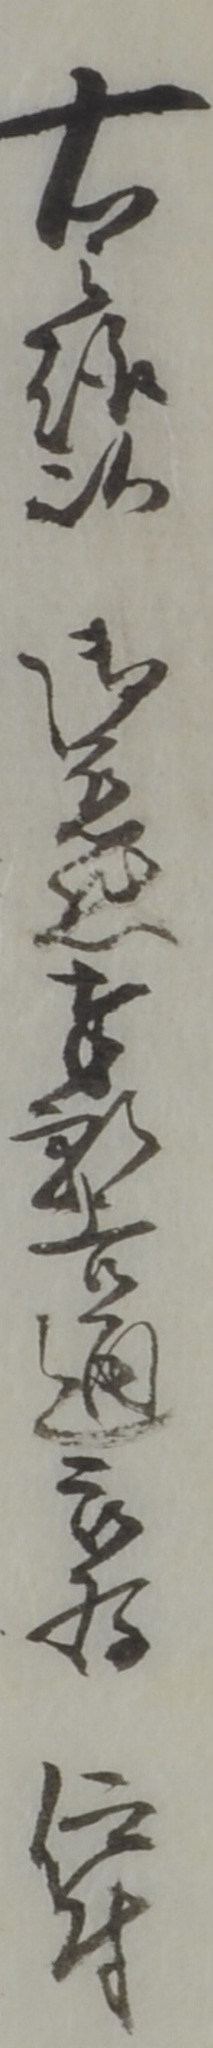右之趣以御慈悲奉願上候通被為仰付
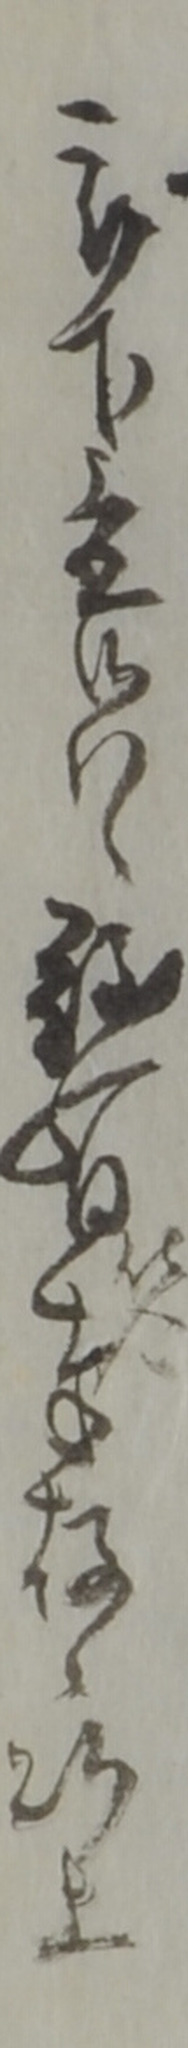被下置候ハヽ難有仕合奉存候以上
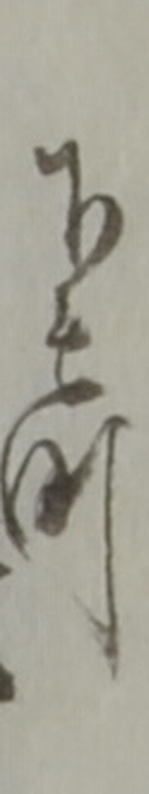下モ町
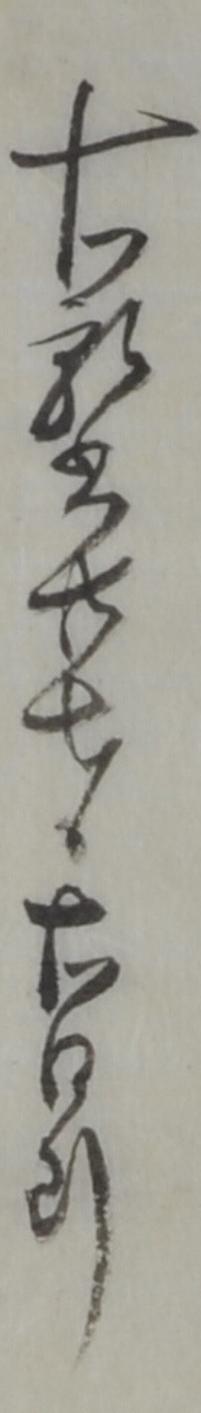右願書廿七日右同断

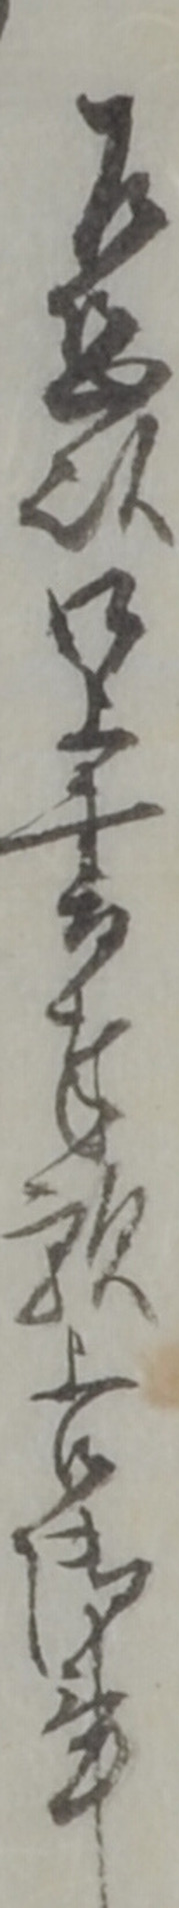乍恐以口上書奉願上候御事
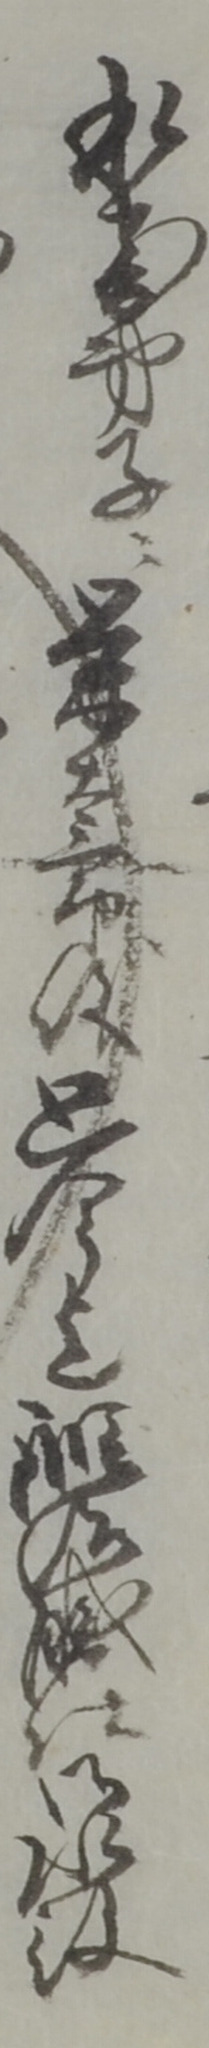私寄弟子ニ栄太郎儀只今迄鍛冶職仕御水役
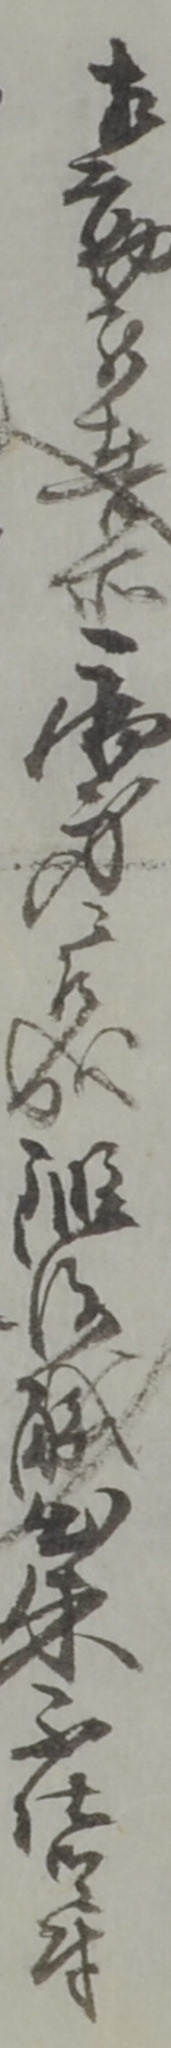相勤罷在候所病身ニ被成鍛冶職出来不仕候ニ付
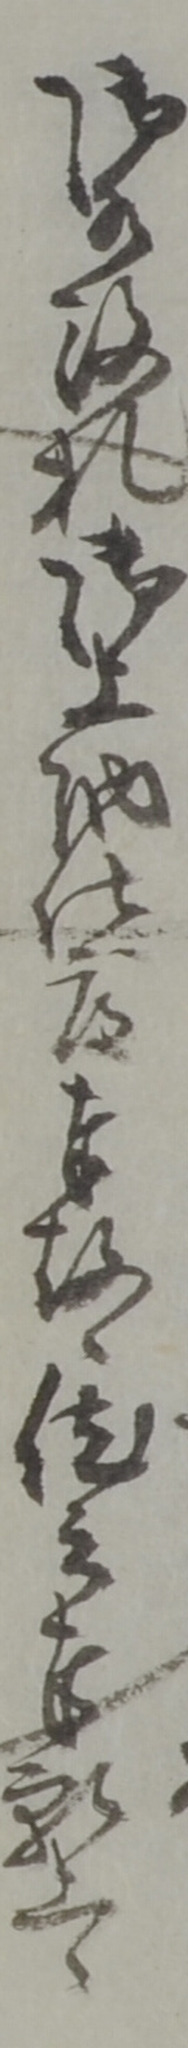御水役札御上納仕度奉存候依之奉願上候
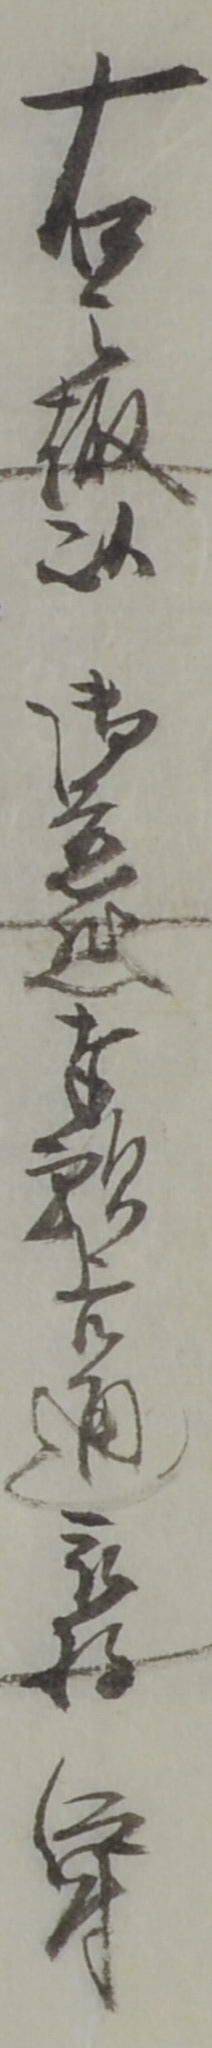右之趣以御慈悲奉願上候通被為仰付
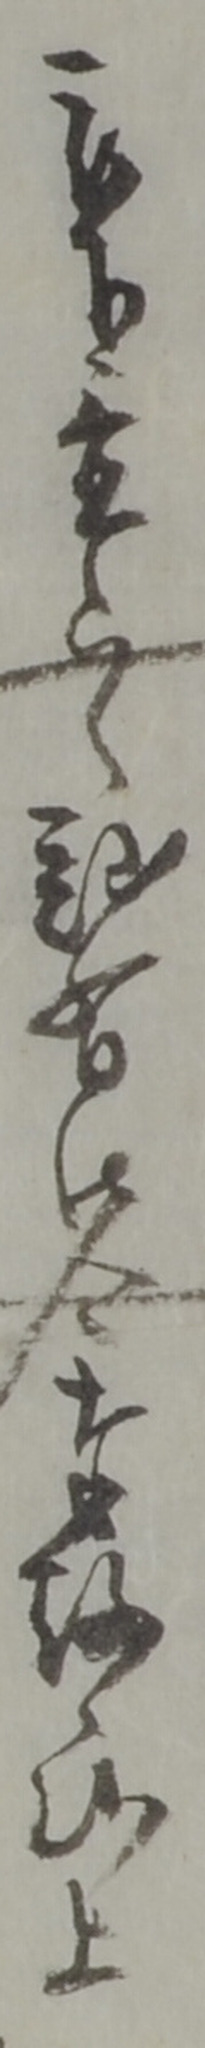被下置候ハヽ難有仕合奉存候以上
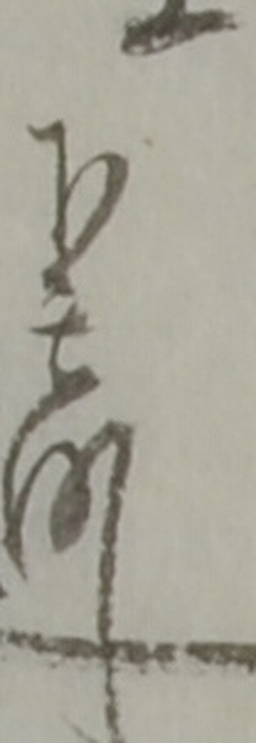下モ町
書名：諸願書控簿
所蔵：伊那市立高遠町図書館・合同会社AMANE
